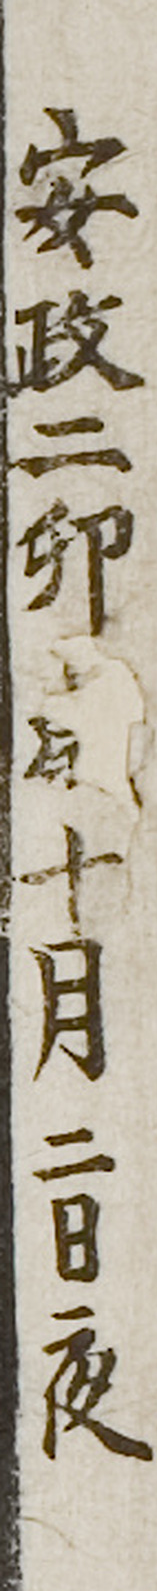安政二卯年十月二日夜
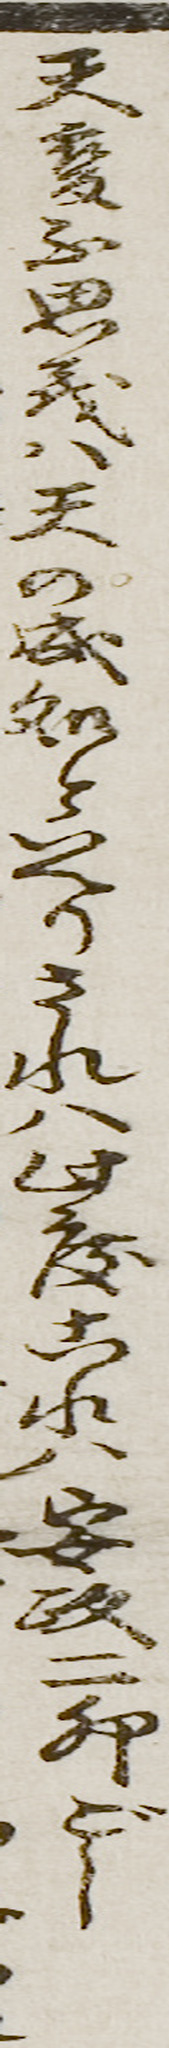天変不思義ハ天の成処といへりされハ此度これハ安政二卯どし
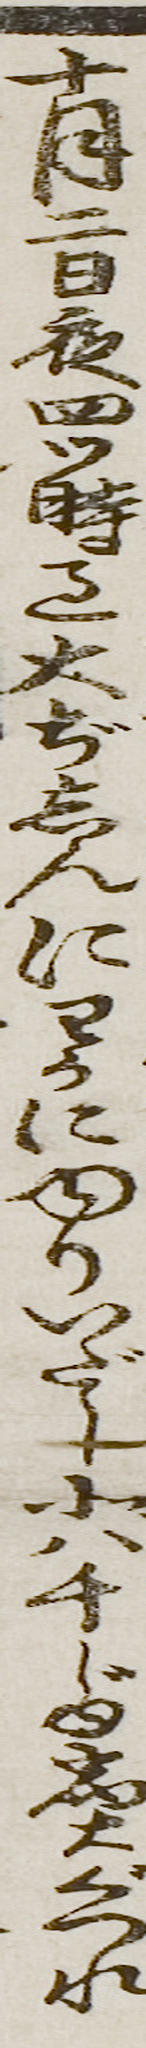十月二日夜四ッ時過大ぢしんにわかにゆりいだし北ハ千じゆ宿大くつれ
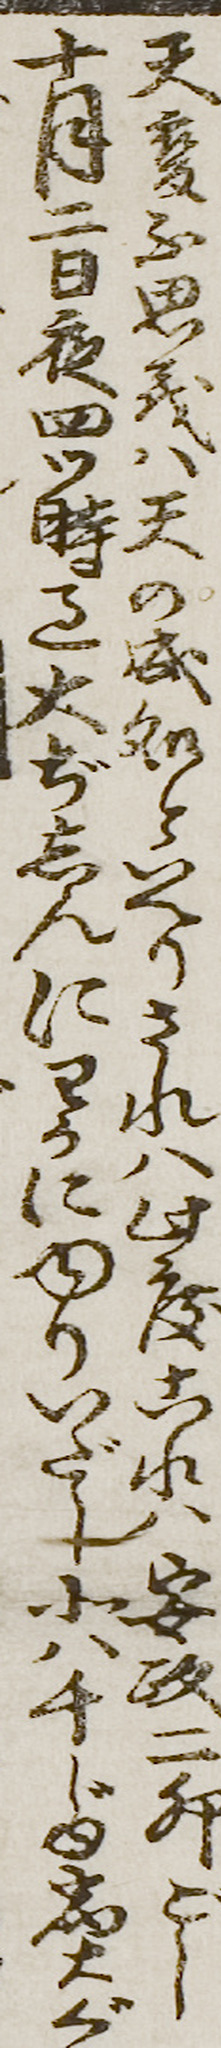十月二日夜四ッ時過大ぢしんにわかにゆりいだし北ハ千じゆ宿大くつれ
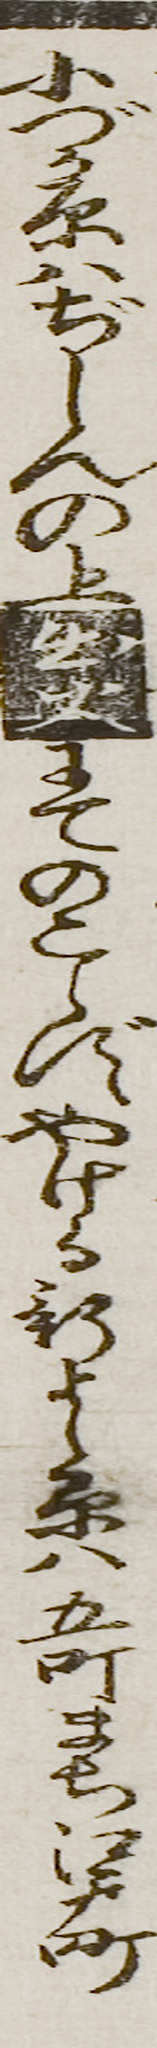小づか原ハぢしんの上出火にてのこらずやける新よし原ハ五町まち江戸町
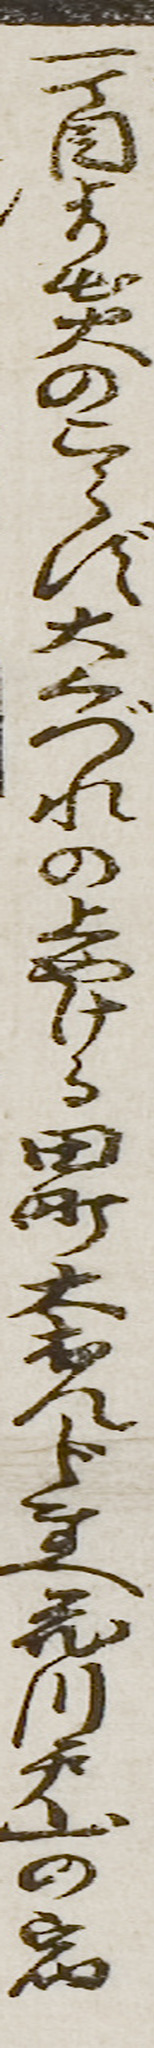一丁目より出火のこらず大くづれの上やける田町大ほんじまへ花川戸やまの宿
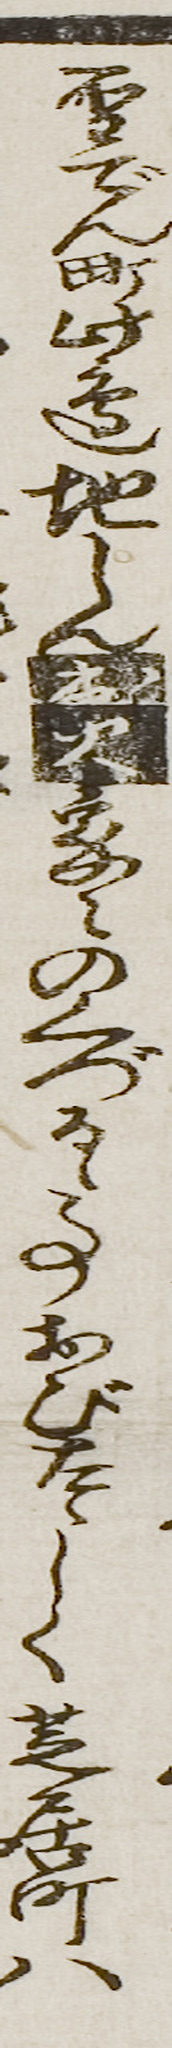聖でん町此辺地しん出火家々のくづるゝ事おびたゞしく芝居町ハ
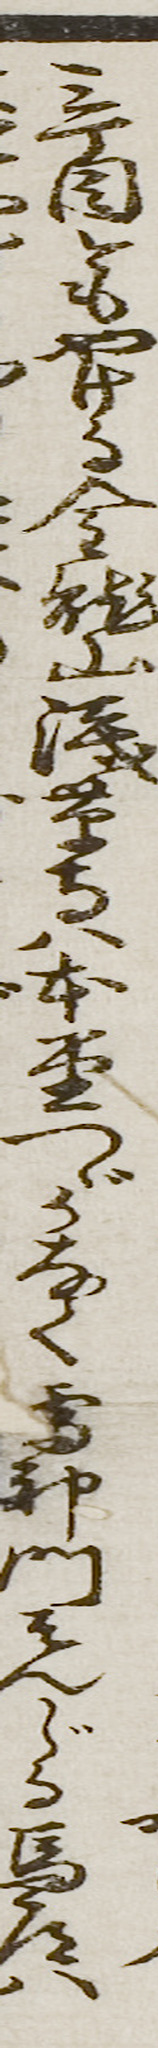三丁目ともやける金龍山浅草寺ハ本堂つゝがなく雷神門そんじる馬道ハ
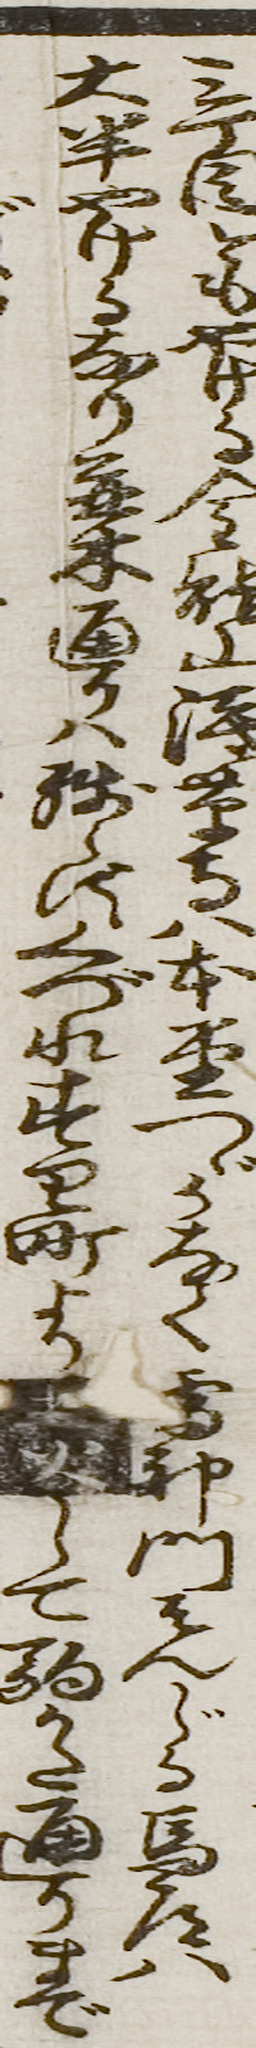大半やけるなり並木通りハ殊之外くづれすわ町より出火して駒かた通りまで
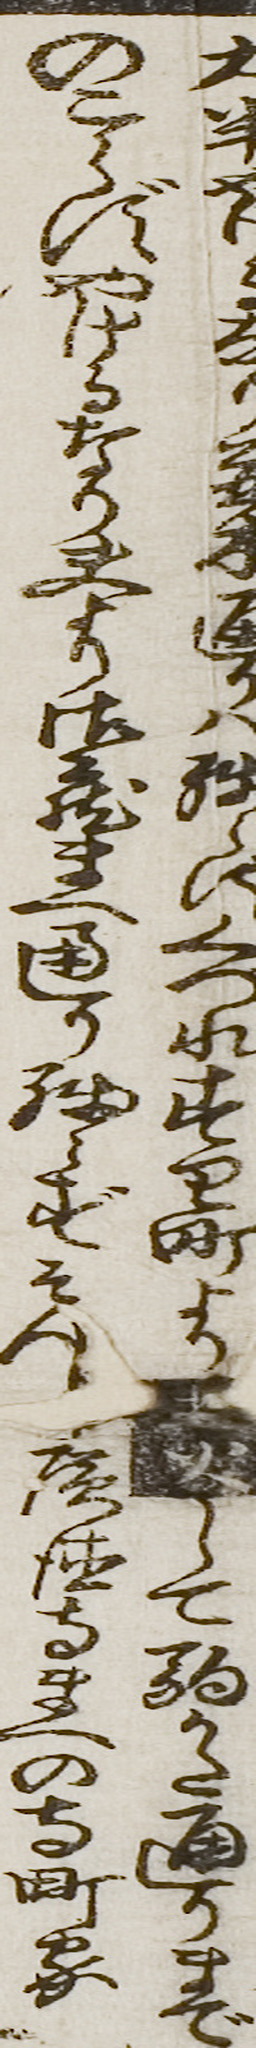のこらずやけるなり夫より御蔵まへ通り残らずそんじ広徳寺まへの寺まち家
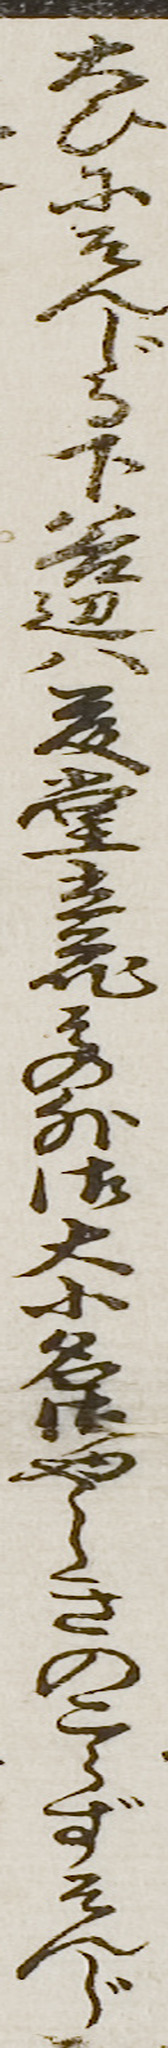大ひにそんじる下谷辺ハ藤堂立花その外御大小名やしきのこらずそんじ
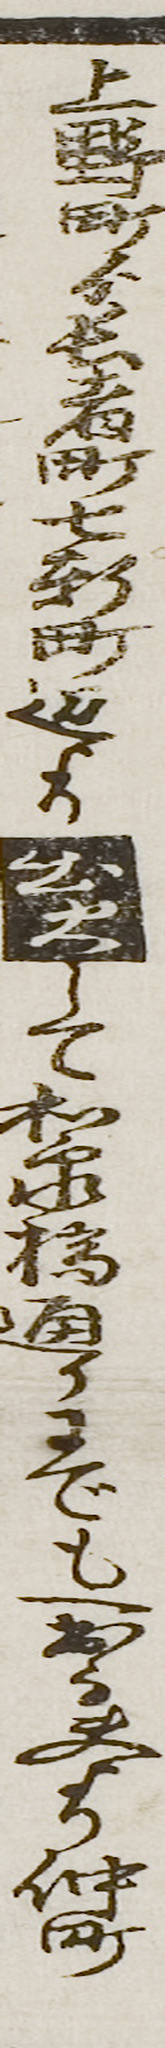上野町ゟ長者町七軒町辺より出火して和泉橋通りまでもへ夫より仲町
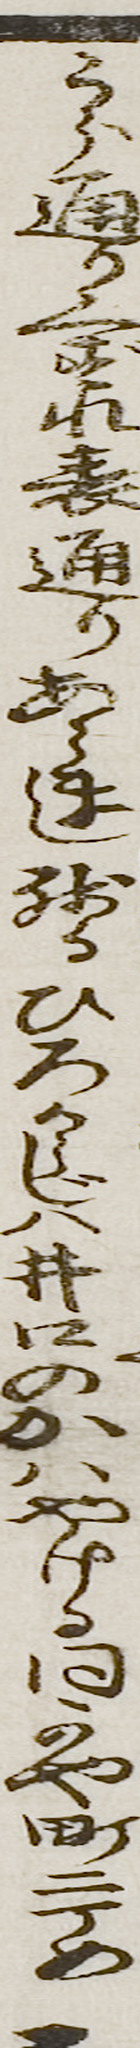うら通りくずれ表通リあらまし残るひろかうじハ井口のかハやける同かや町二丁め
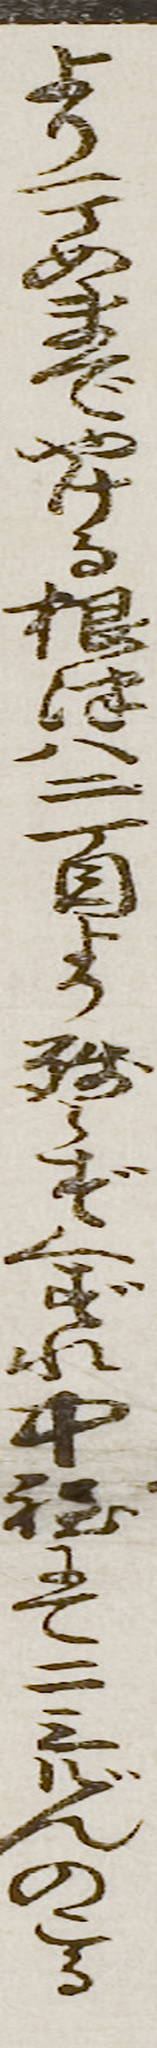より一丁めまでやける根津ハ二丁目より残らずくずれ中程にて二三げんのこる
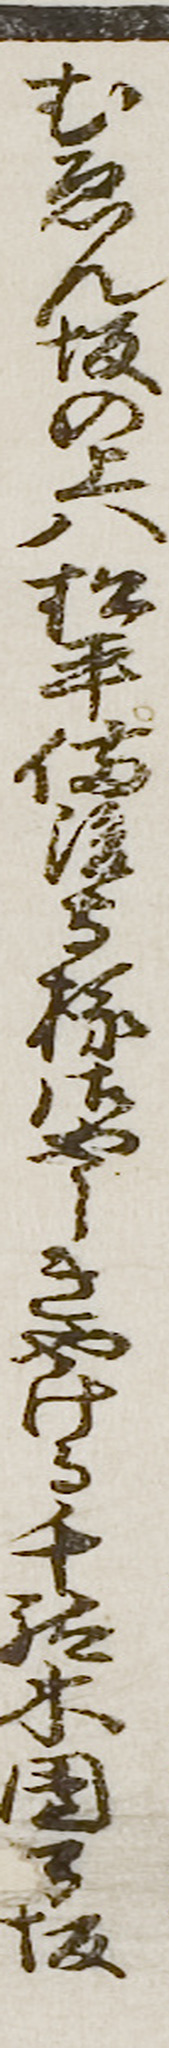むゑん坂の上ハ松平備後守様御やしきやける千駄木団子坂
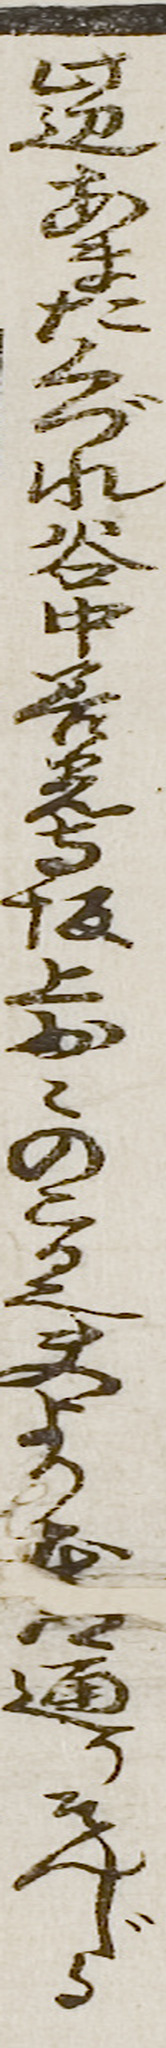此辺あまたくづれ谷中善光寺坂上少々のこる也夫より本郷通りそんじる
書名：関東江戸大地震并大火方角場所附
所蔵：東京大学総合図書館 General Library in the University of Tokyo, JAPAN
